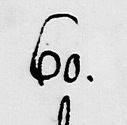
br¬
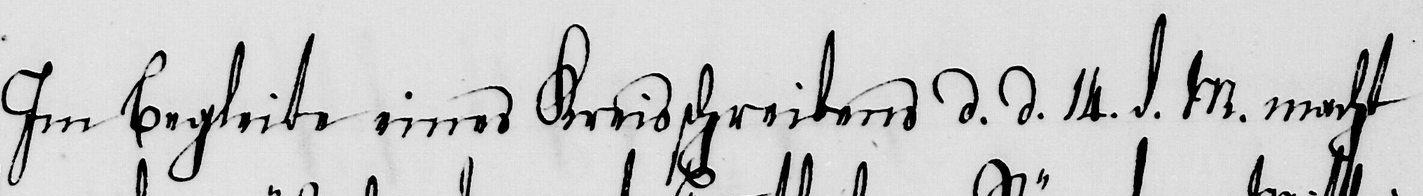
Im Begleite eines Kreisschreibens d. d. 14. d. M. macht
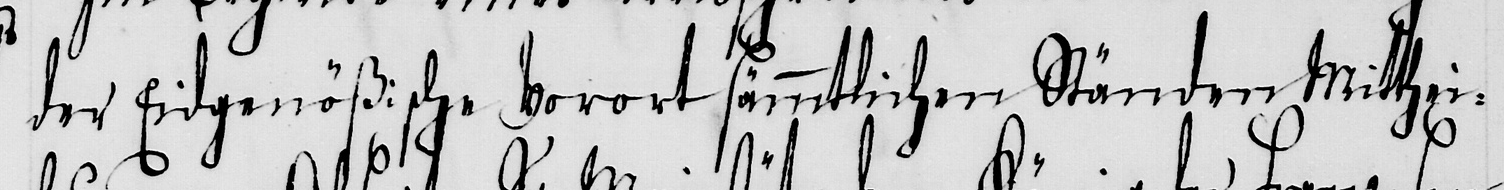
der Eidgenößische Vorort sämmtlichen Ständen Mitthei¬
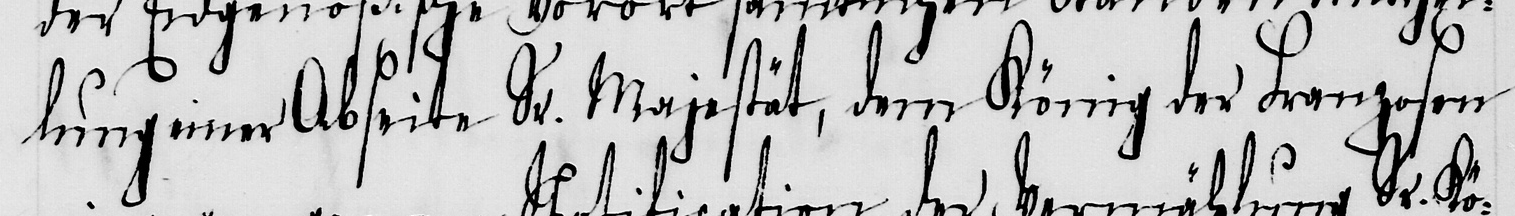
lung einer Abseite Sr. Majestät, dem König der Franzosen
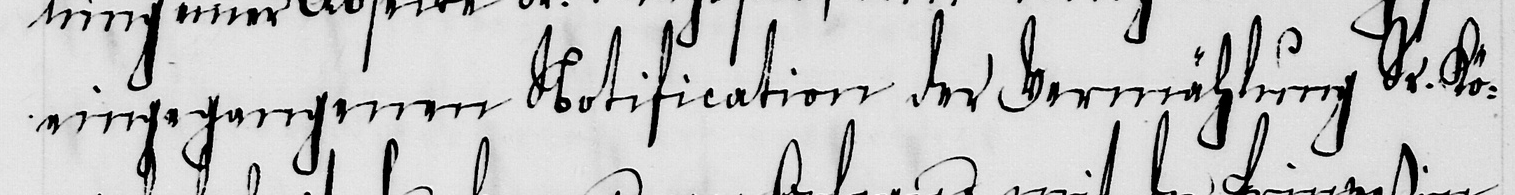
eingegangenen Notification der Vermählung Sr. Kö¬
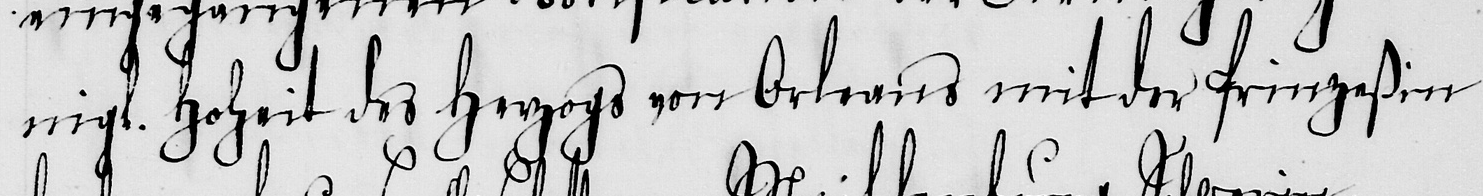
nigl. Hoheit des Herzogs von Orleans mit der Prinzeßin
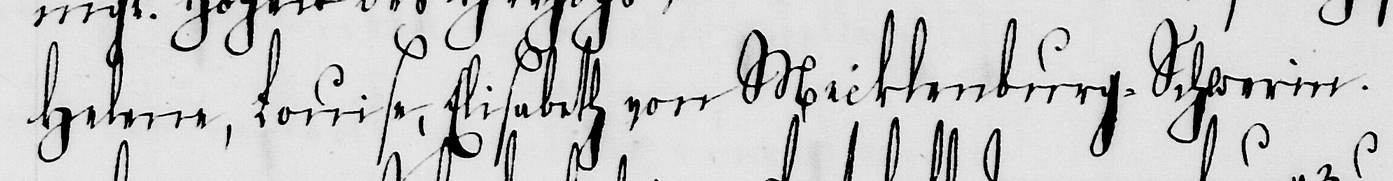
Helene, Louise, Elisabeth von Mecklenburg-Schwerin.
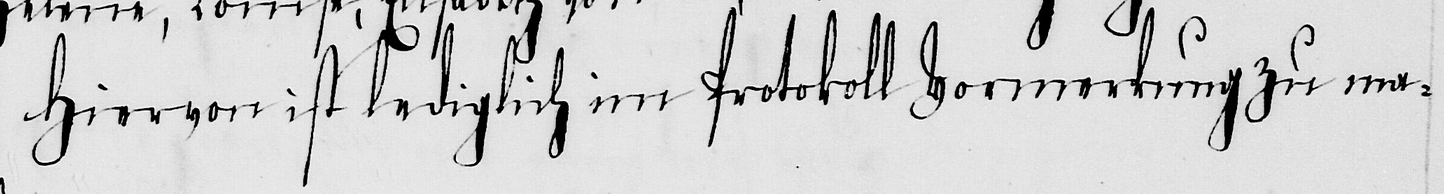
Hiervon ist lediglich im Protokoll Vormerkung zu ma¬
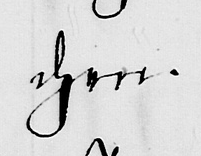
chen.
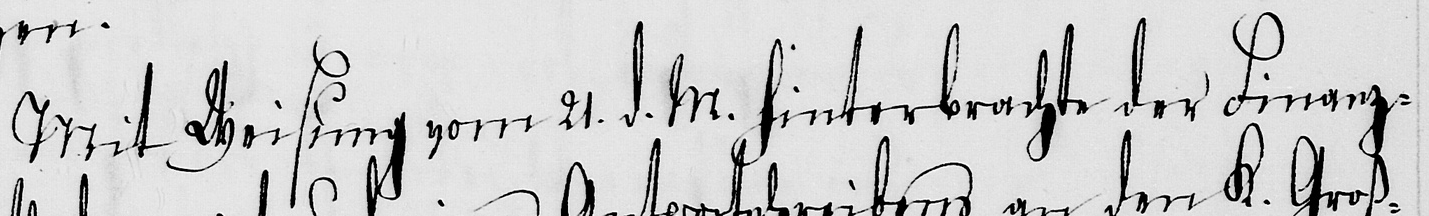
Mit Weisung vom 21. d. M. hinterbrachte der Finanzr¬
